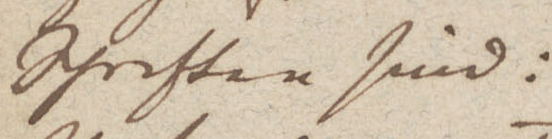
Schriften sind:
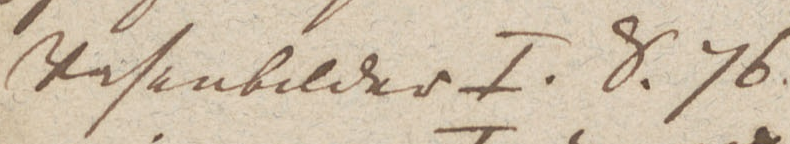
Vasenbilder I. S. 76.
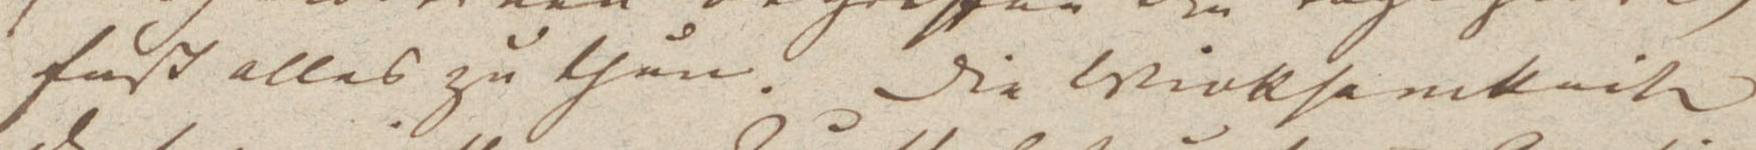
fast alles zu thun. Die Wirksamkeit
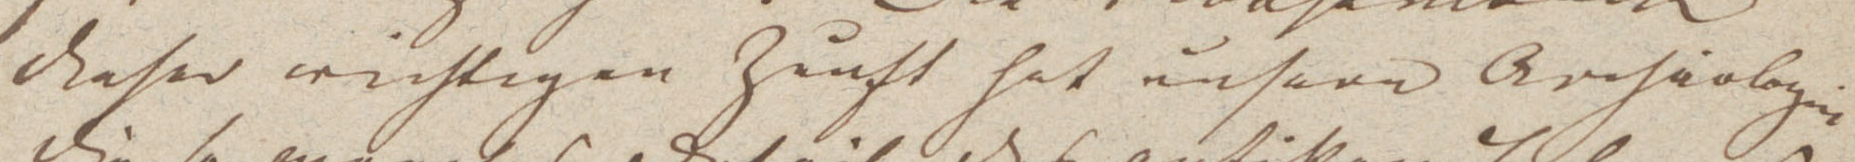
dieser wichtigen Zunft hat unsere Archäologie
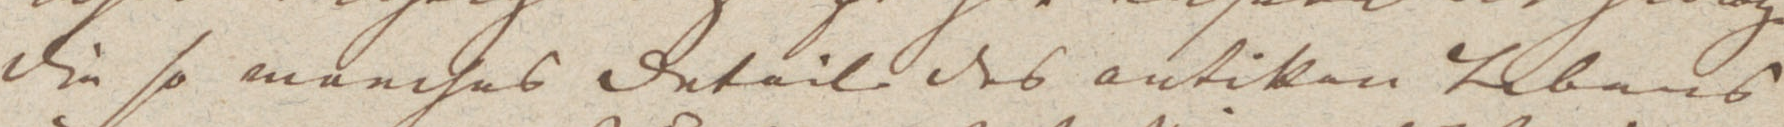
die so manches Detail des antiken Lebens
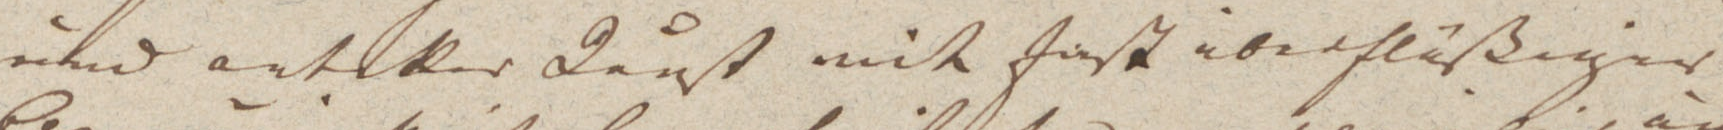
und antiker Kunst mit fast überflüssiger
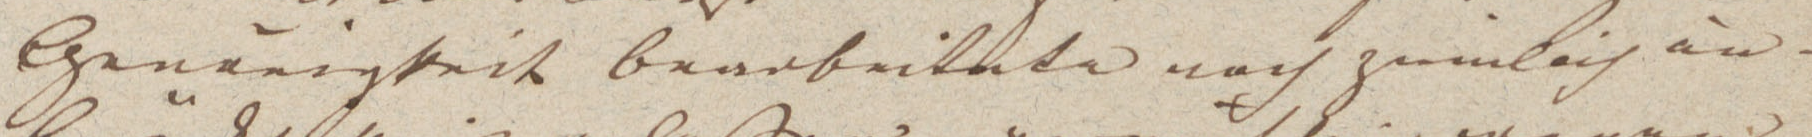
Genauigkeit bearbeitete noch ziemlich un-
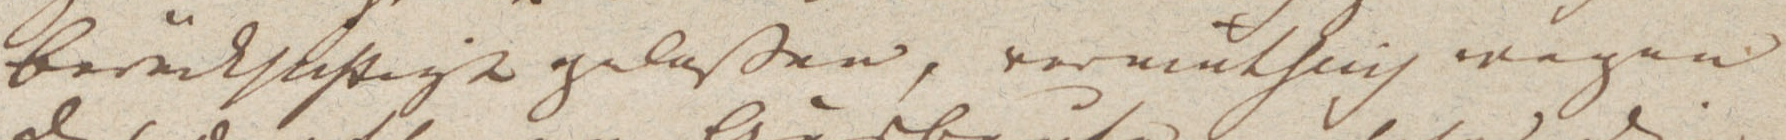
berücksichtigt gelassen, vermuthlich wegen
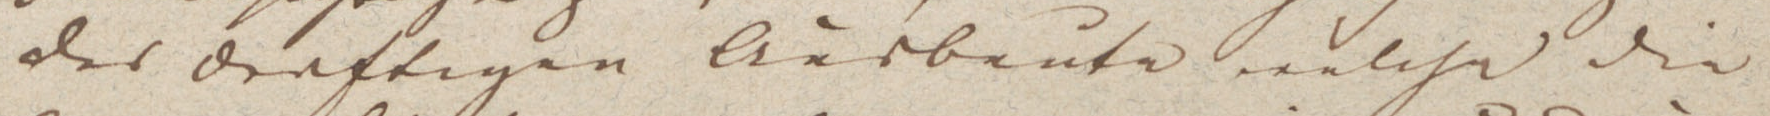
der durftigen Ausbeute welche die
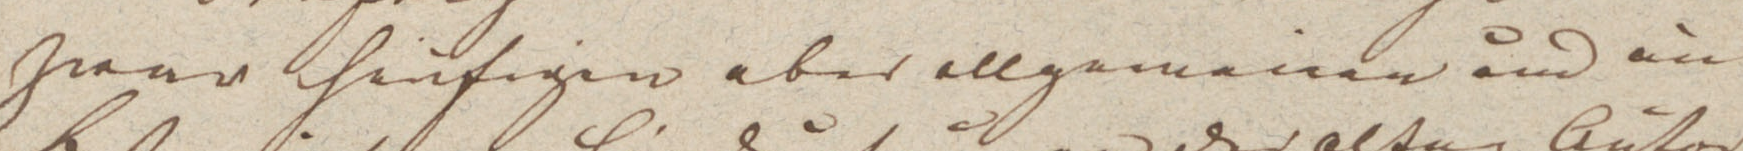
zwar häufigen aber allgemeinen und un-
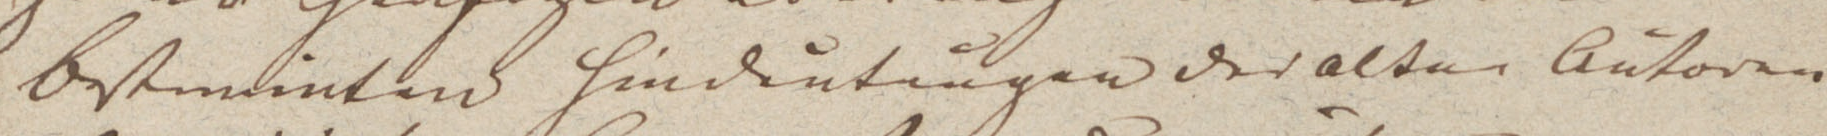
bestimmten Hindeutungen der alten Autoren
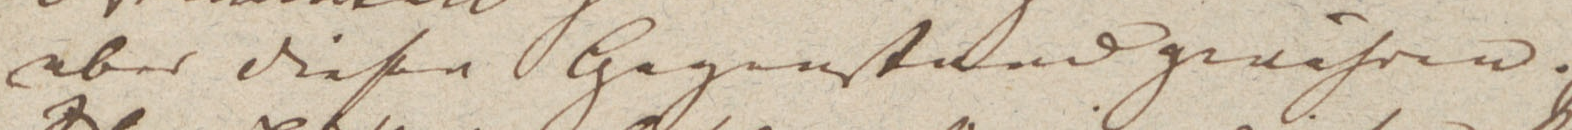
uber diesen Gegenstand gewähren.
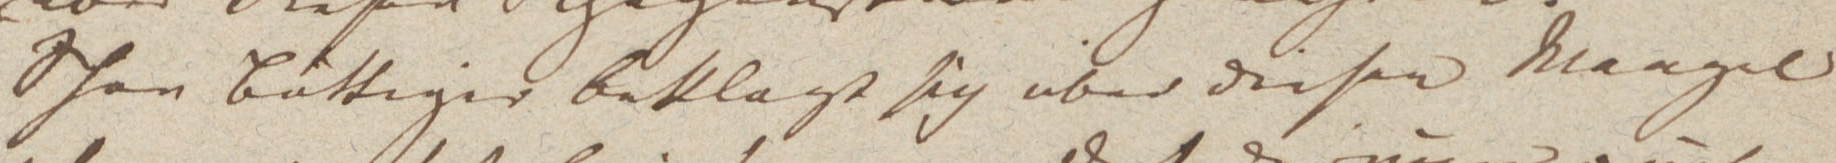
Schon Böttiger beklagt sich über diesen Mangel
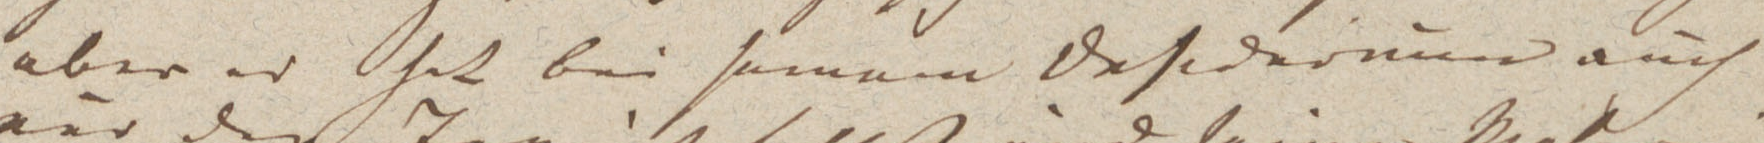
aber er hat bei seinem Desiderium auch
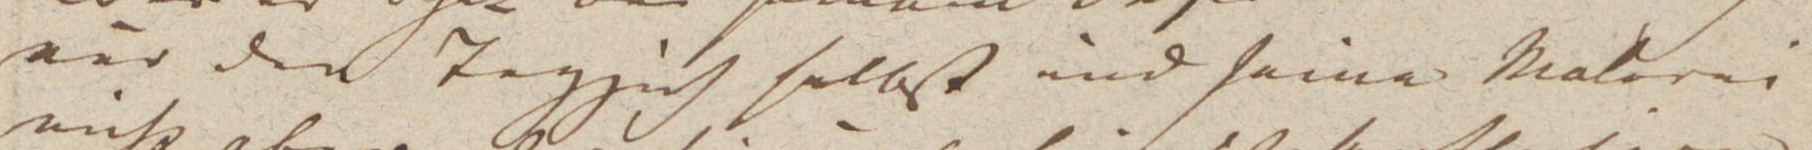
nur den Teppich selbst und seine Malerei
